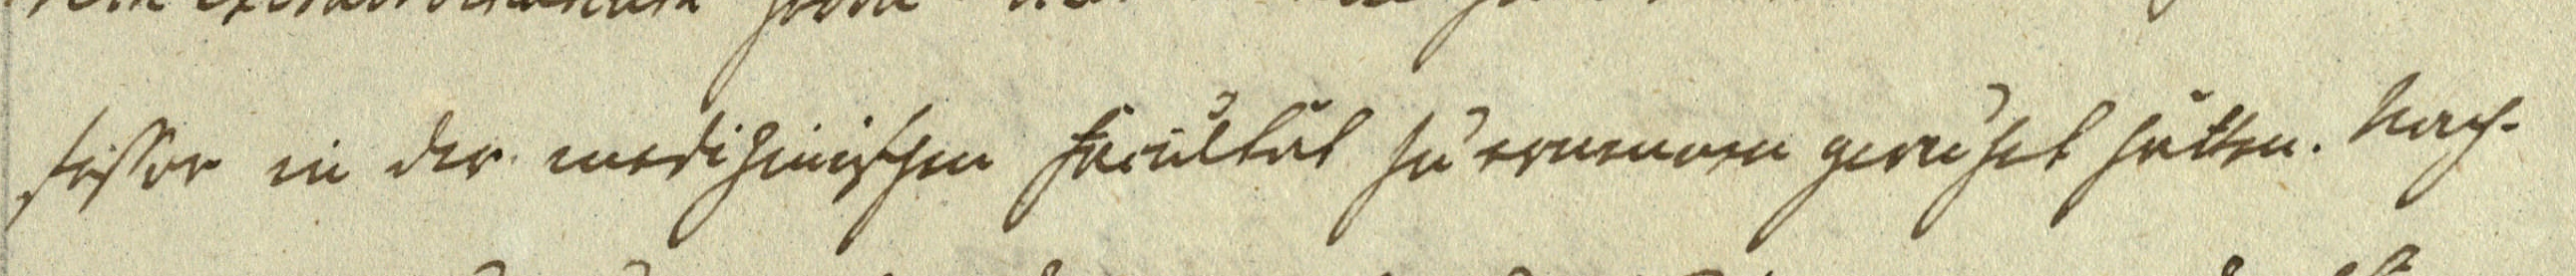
fessor in der medizinischen Facultät zu ernennen geruhet hätten. Nach¬
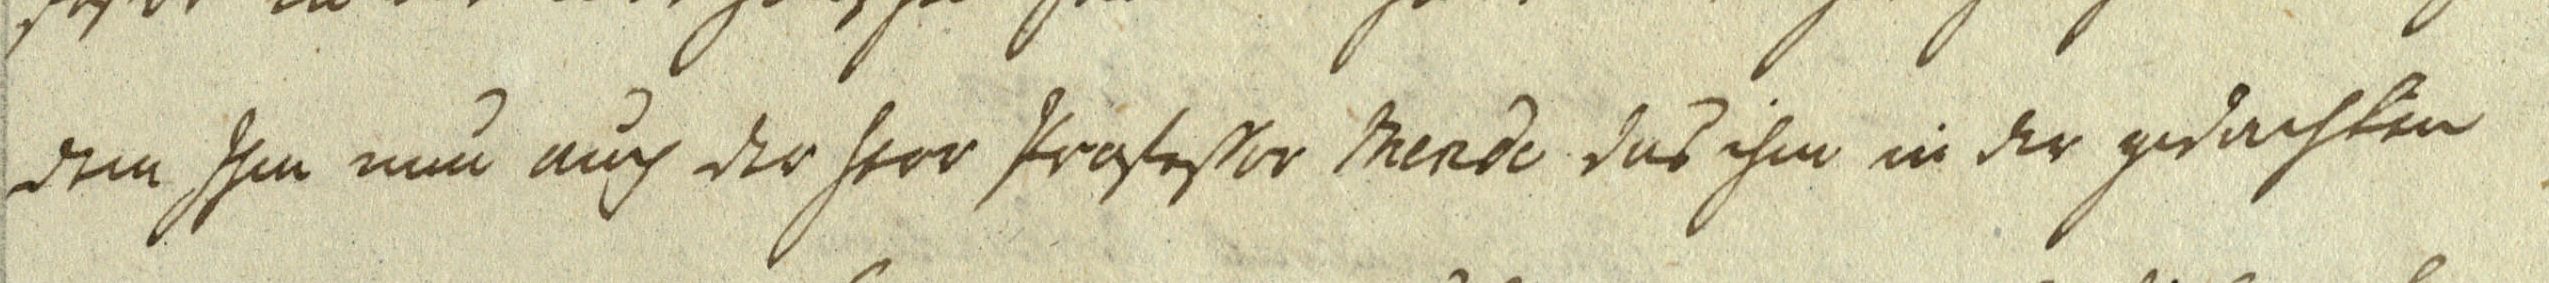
dem Ihm nun auch der Herr Professor Mende das ihm in der gedachten
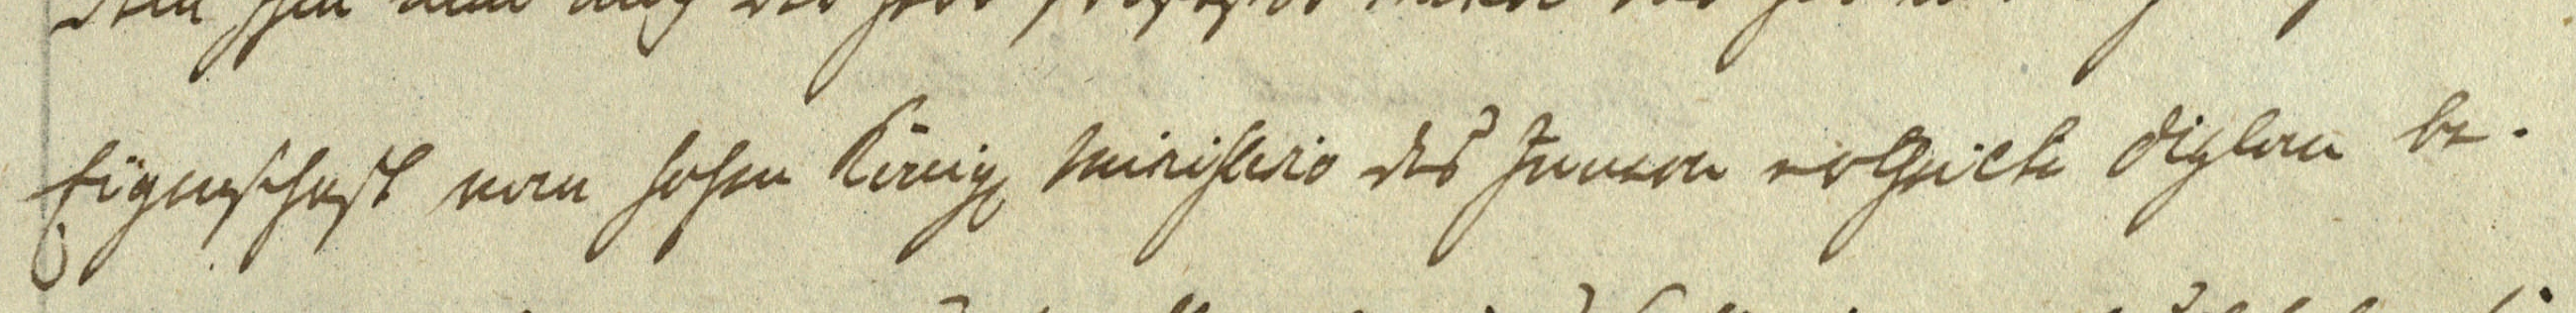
Eigenschaft vom hohen Königl Ministerio des Innern ertheilte Diplom be¬
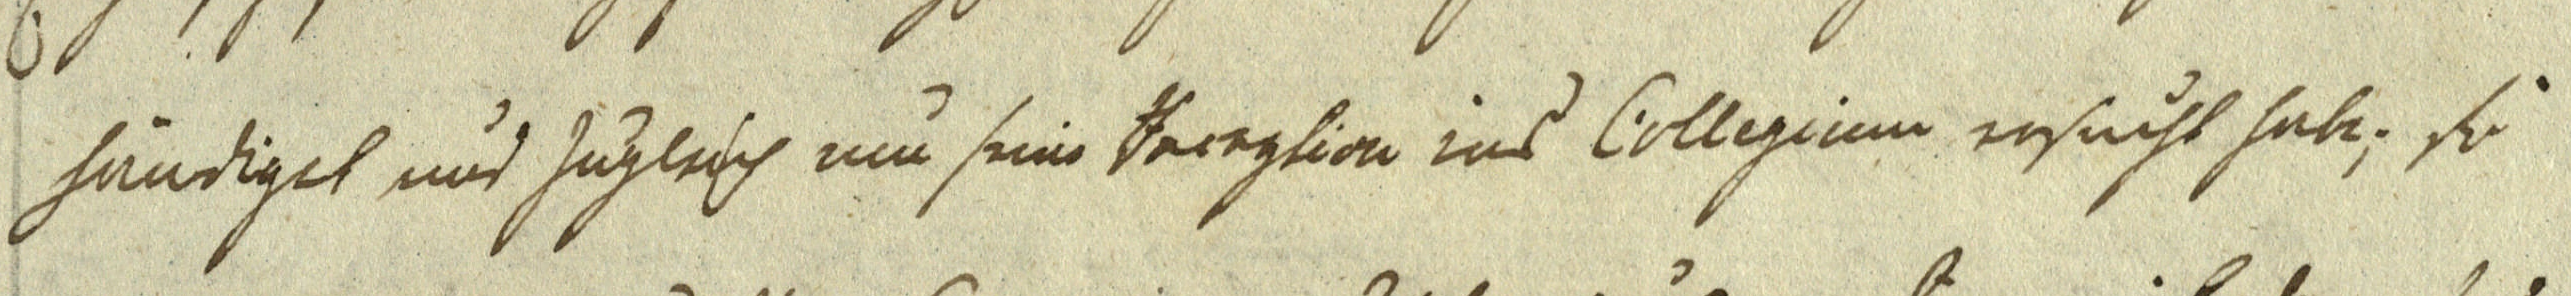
händiget und zugleich um seine Reception ins Collegium ersucht habe, so
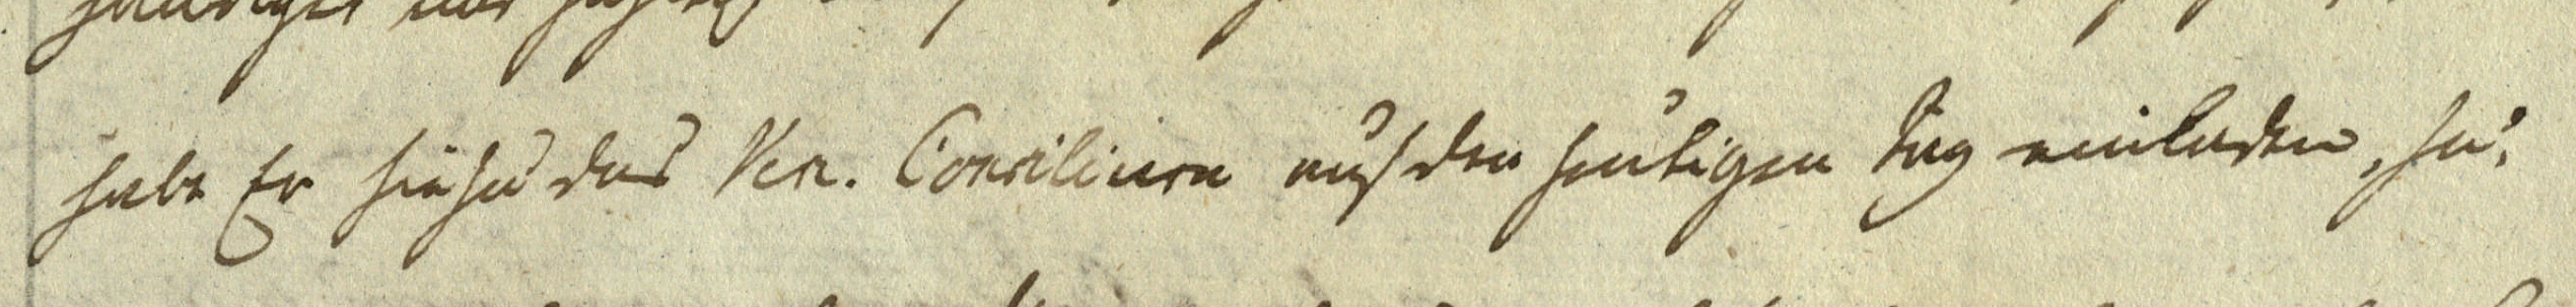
habe Er hiezu das Ven. Concilium auf den heutigen Tag einladen, zu¬
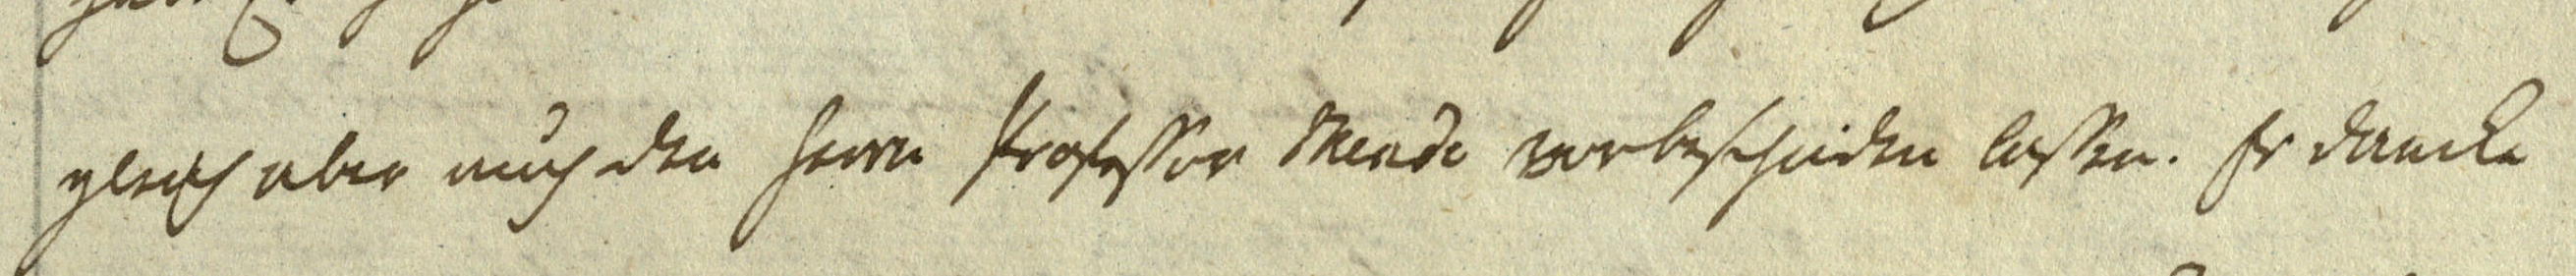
gleich aber auch den Herrn Professor Mende vorbescheiden lassen. Er dancke
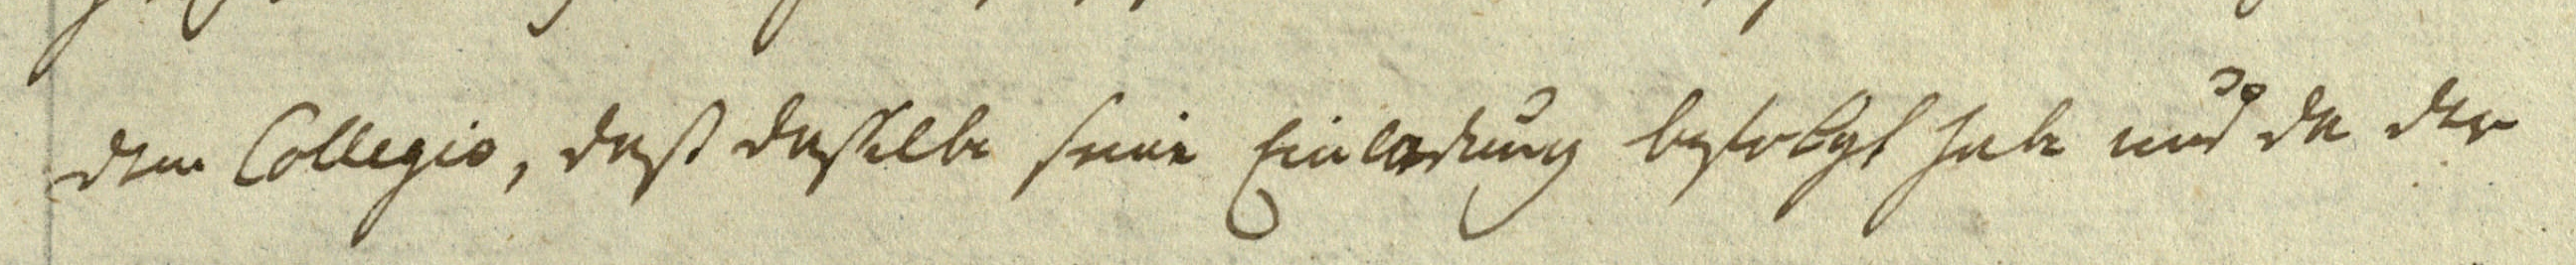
dem Collegio, daß dasselbe seine Einladung befolgt habe und da der
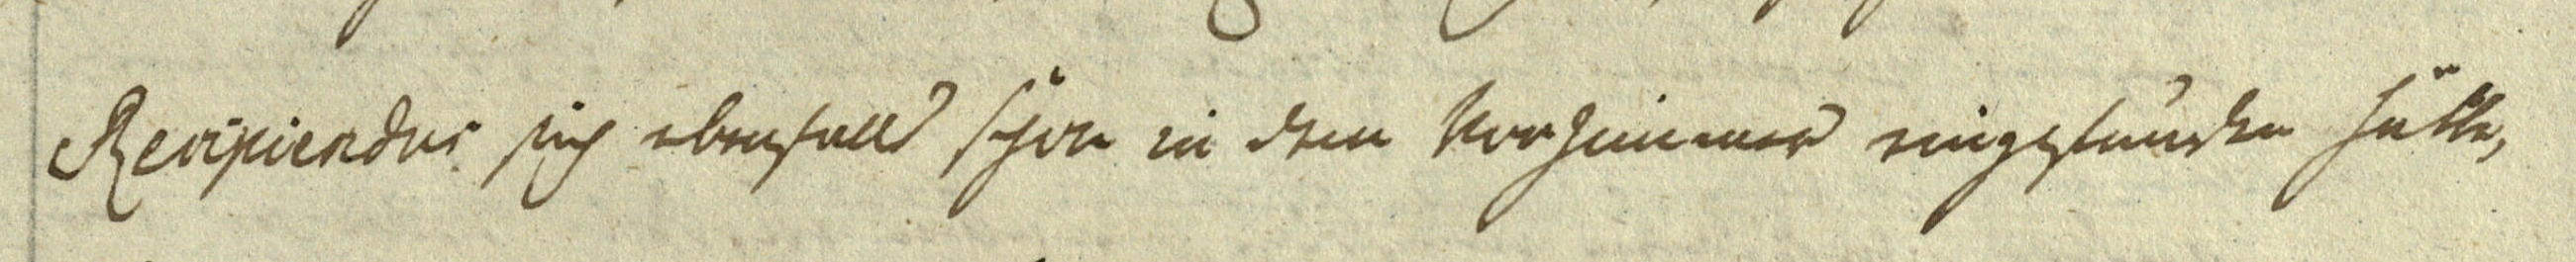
Recipiendus auch ebenfalls schon in dem Vorzimmer eingefunden hätte,
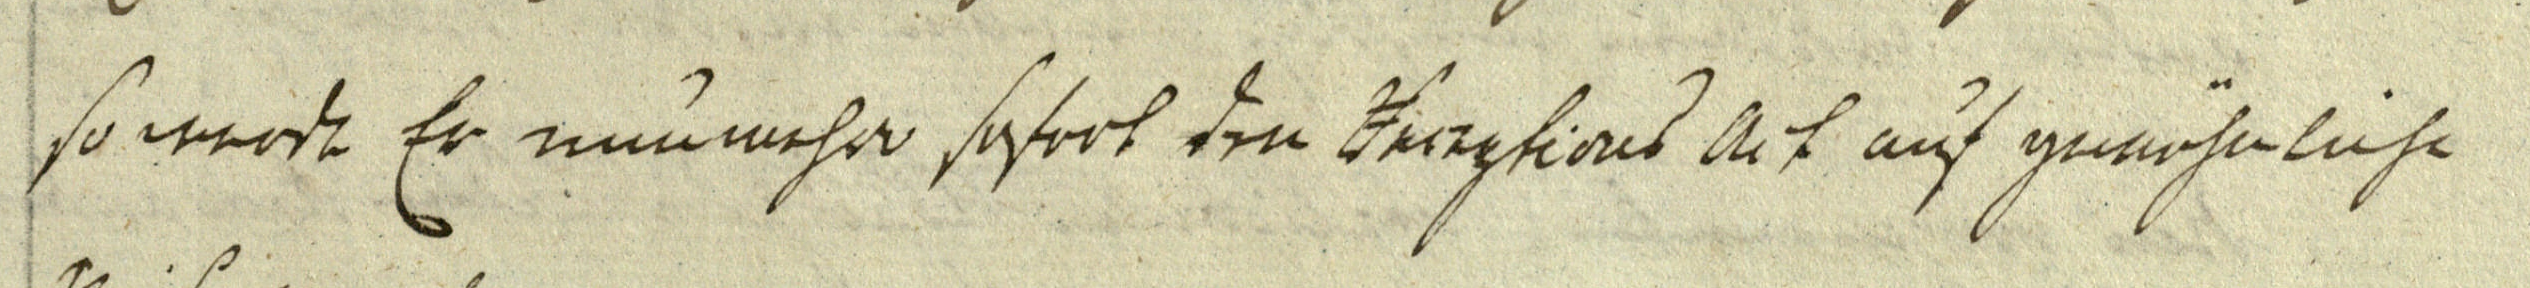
so werde Er nunmehr sofort den Receptions Act auf gewöhnliche
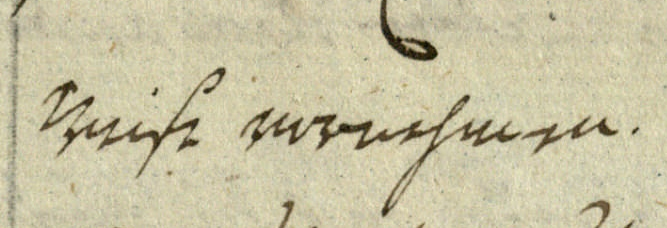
Weise vornehmen.
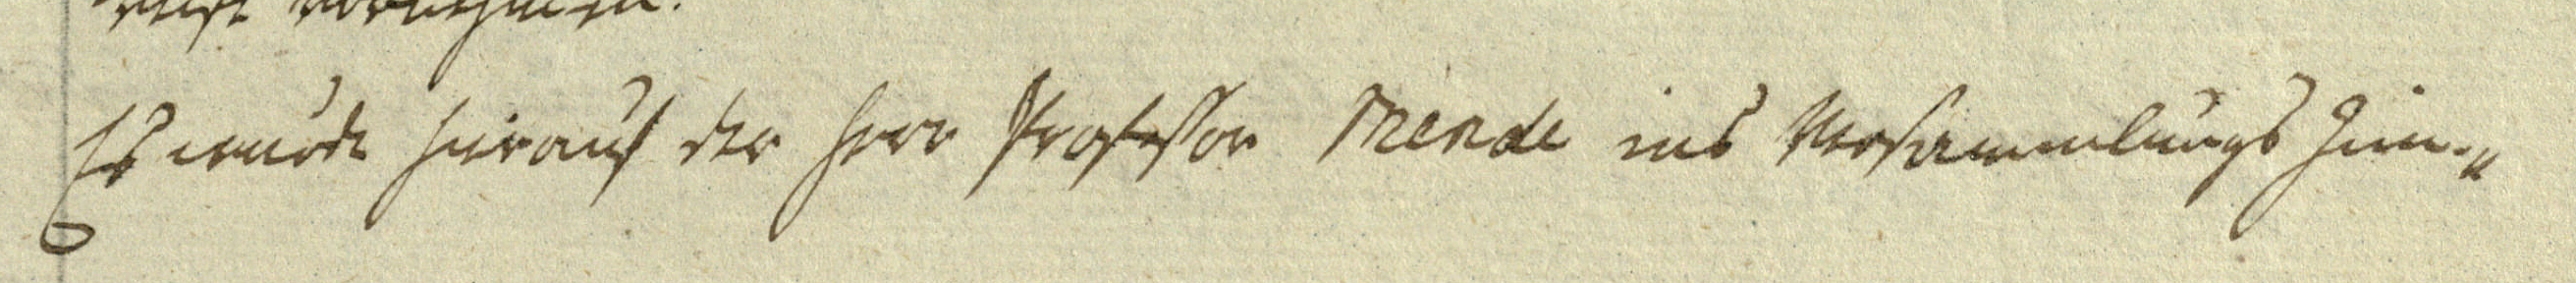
Es wurde hierauf der Herr Professor Mende ins Versammlungszim¬
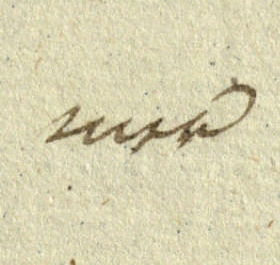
mer
